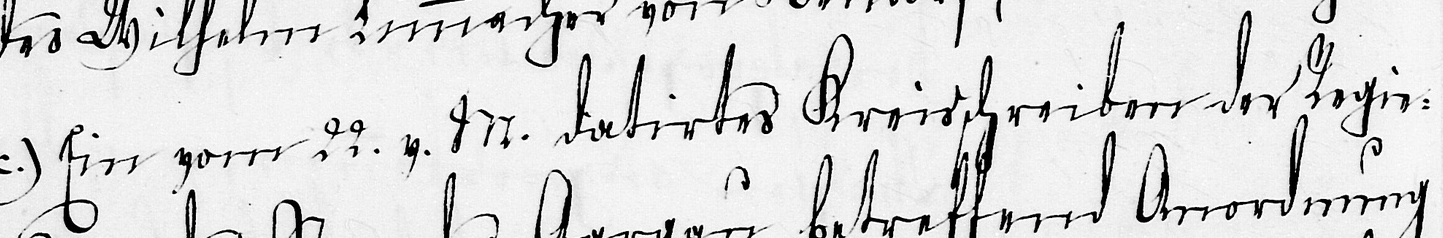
c.) Ein vom 22. v. M. datirtes Kreisschreiben der Regie¬
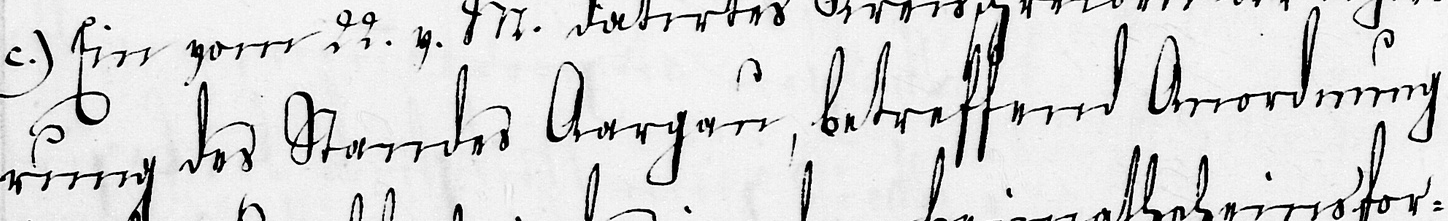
rung des Standes Aargau, betreffend Anordnung
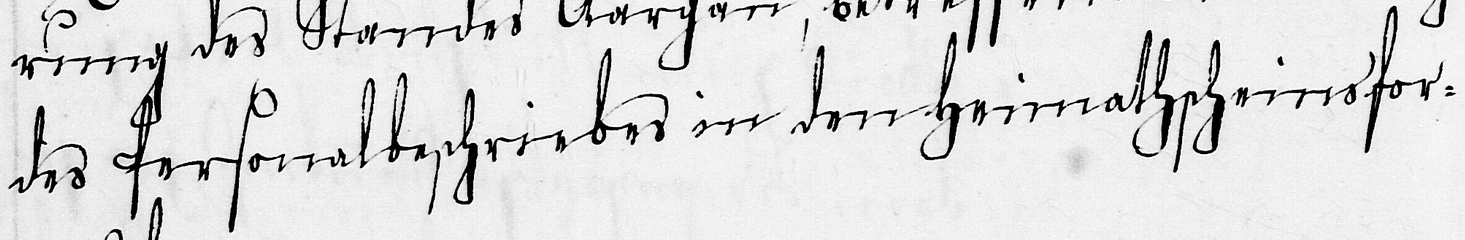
des Personalbeschriebes in den Heimathscheinsfor¬
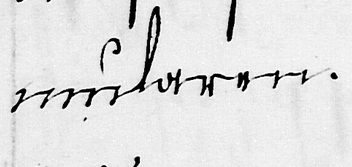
mularen.
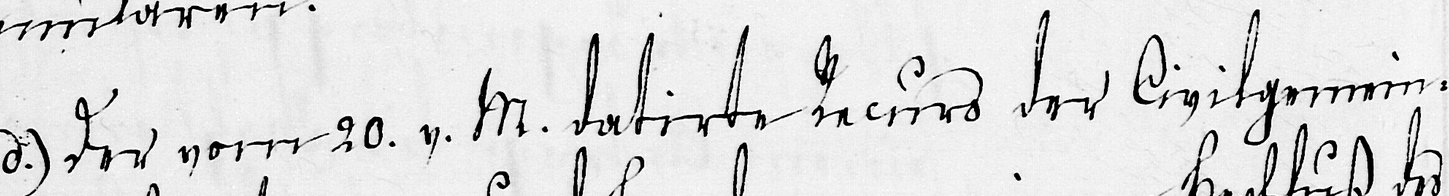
d.) Der vom 20. v. M. datirte Recurs der Civilgemein¬
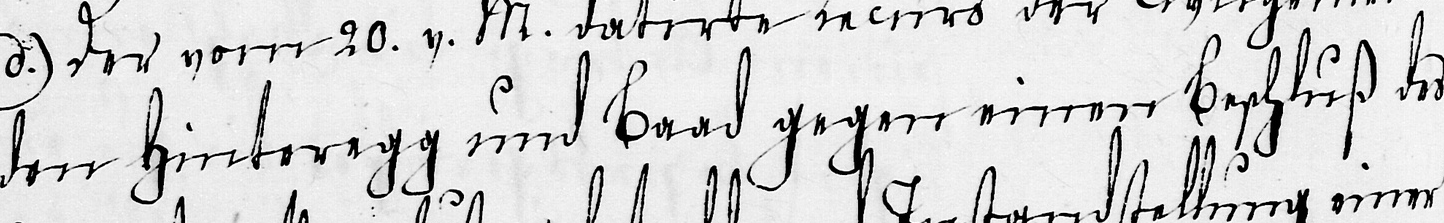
den Hinteregg und Baad gegen einen Beschluß des
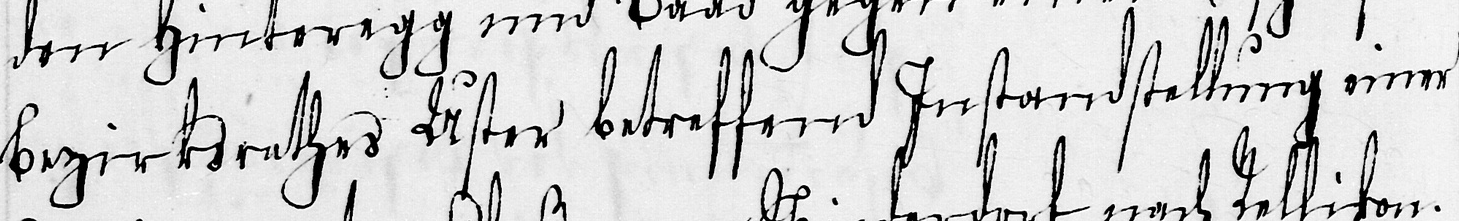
Bezirksrathes Uster betreffend Instandhaltung einer
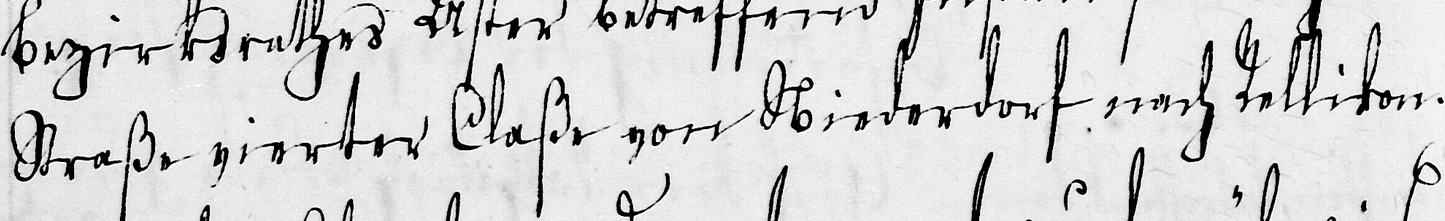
Straße vierter Claße von Niederdorf nach Rellikon.
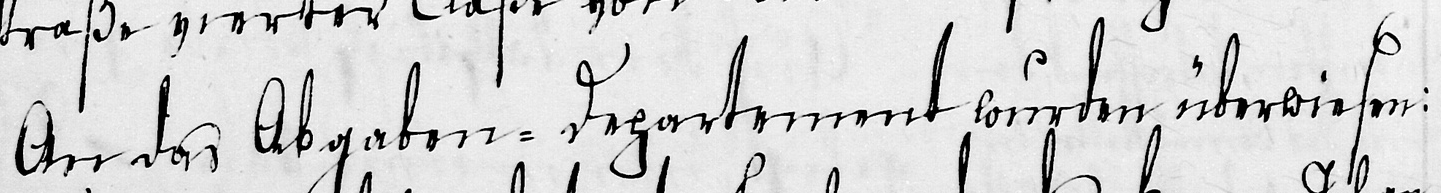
An das Abgaben-Departement wurden überwiesen:
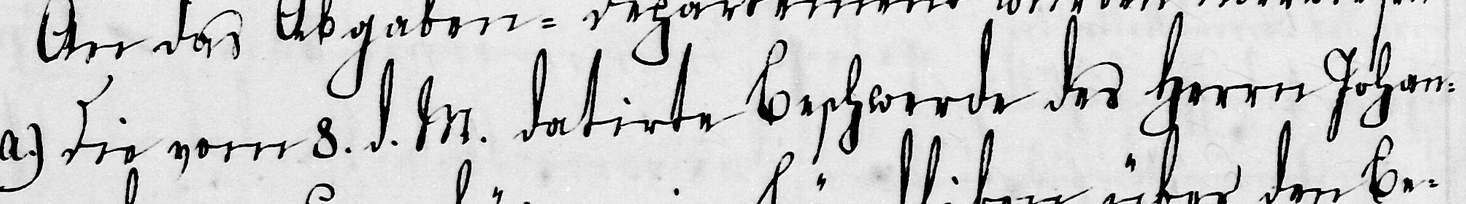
a.) Die vom 8. d. M. datirte Beschwerde des Herrn Johan¬
